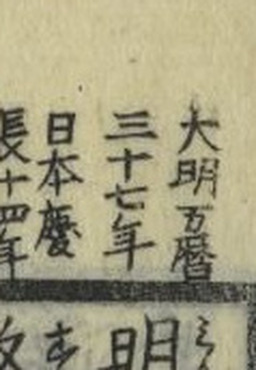三十七年
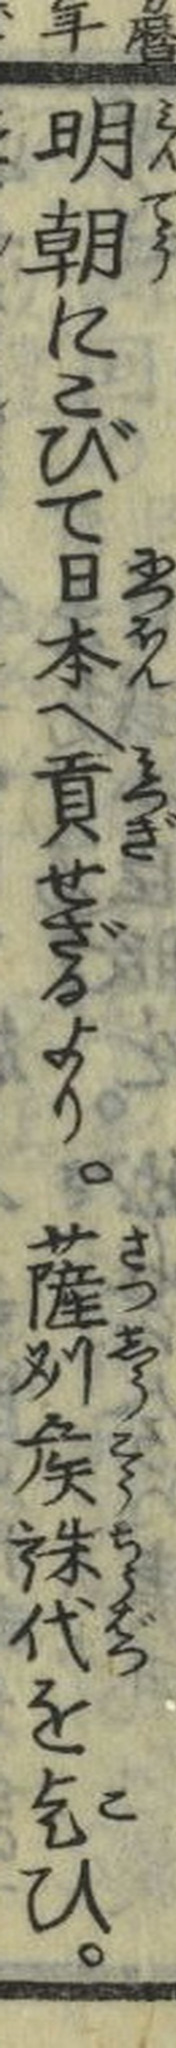明朝にこびて日本へ貢せざるより。薩州候誅伐を乞ひ。
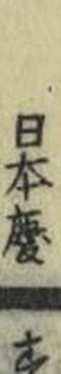日本慶
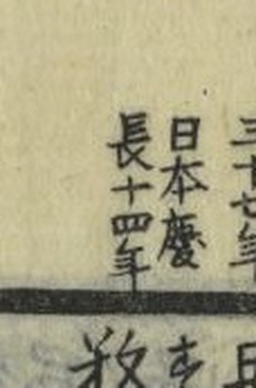長十四年
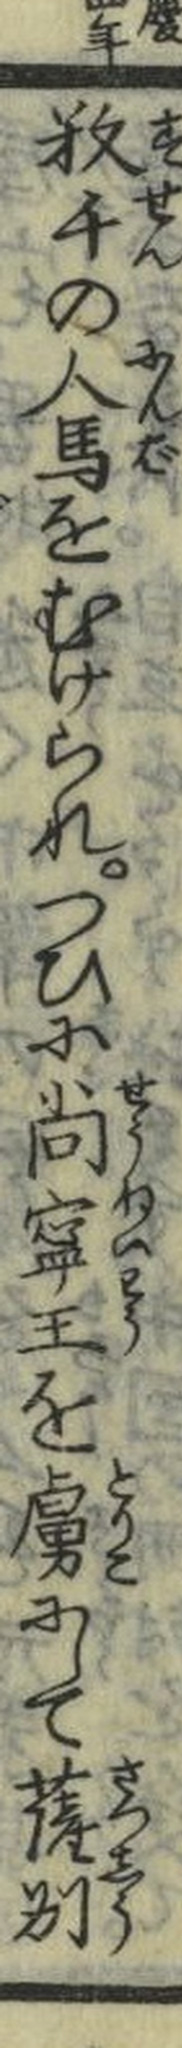敉千の人馬をむけられ。つひに尚寧王を虜にして薩州
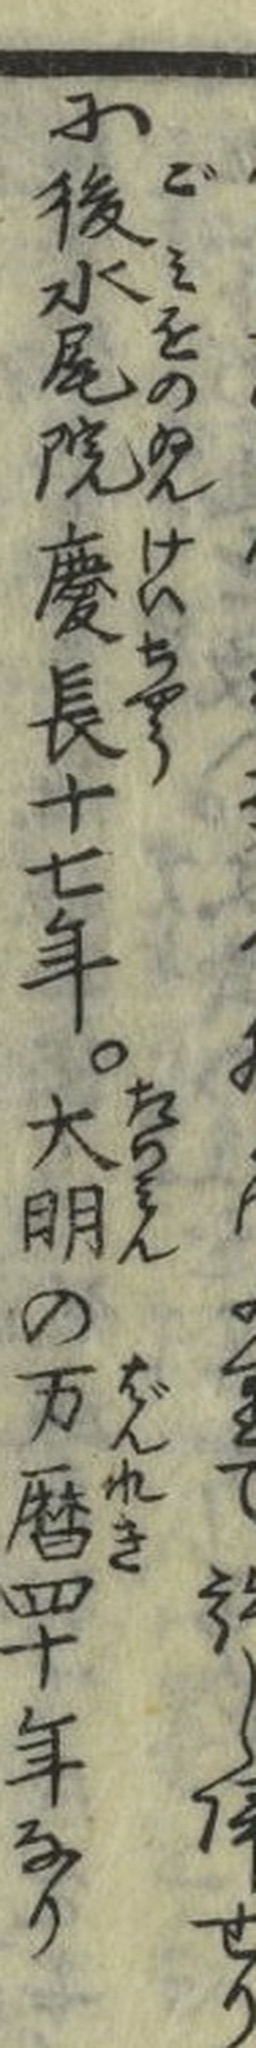に後水尾院慶長十七年。大明の万歴四十年なり

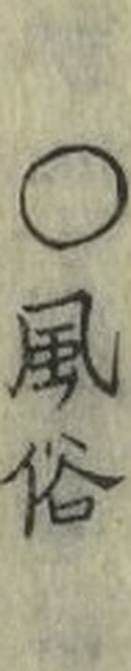〇風俗
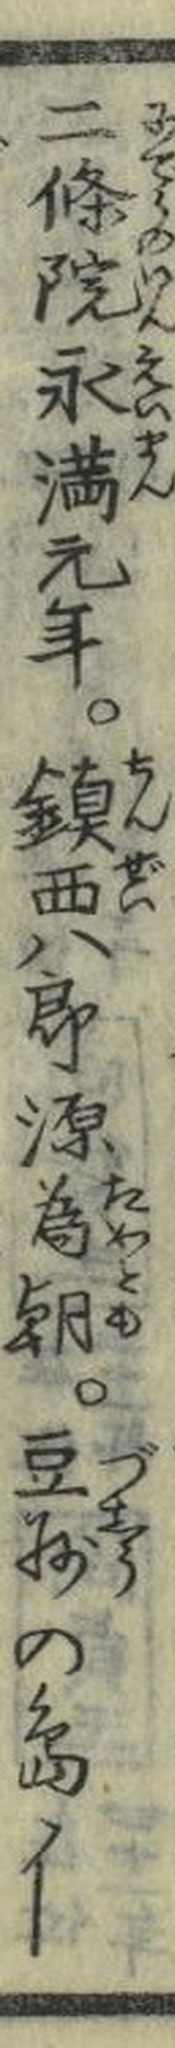二條院永満元年。鎮西八郎源為朝。豆州の島に
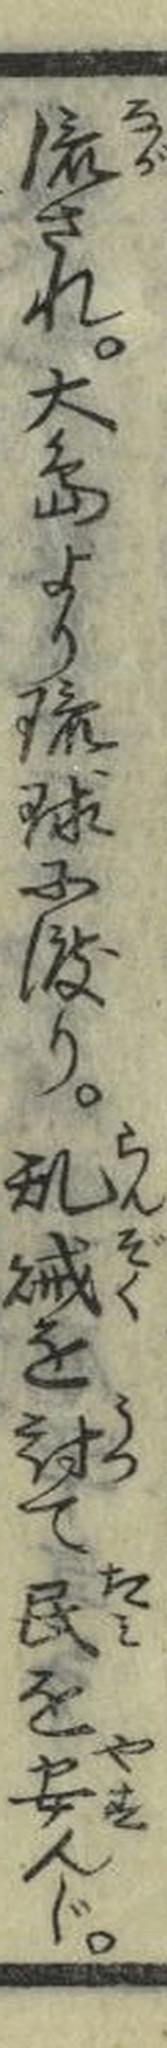流され。大島より琉球に渡り。乱賊を討て民を安んじ。
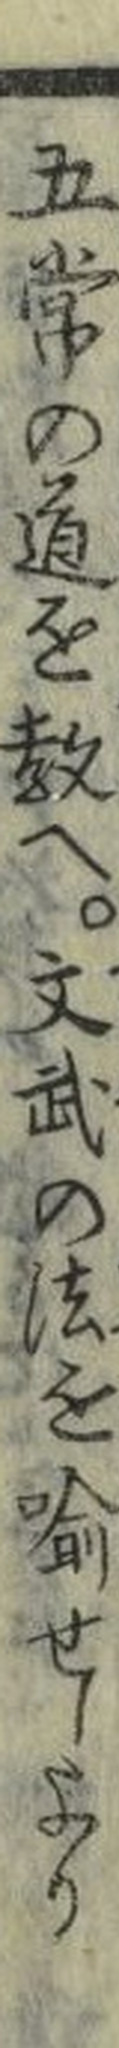五常の道を教ヘ。文武の法を喩せしより
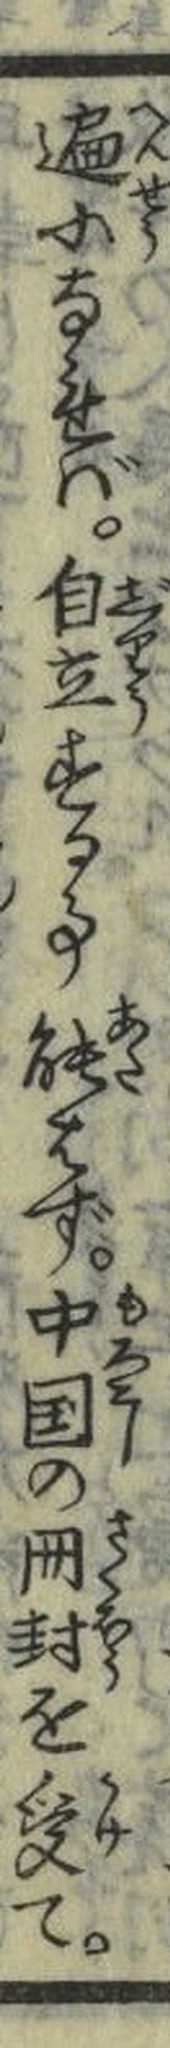遍小なれバ。自立する事能はず。中国の冊封を受て。
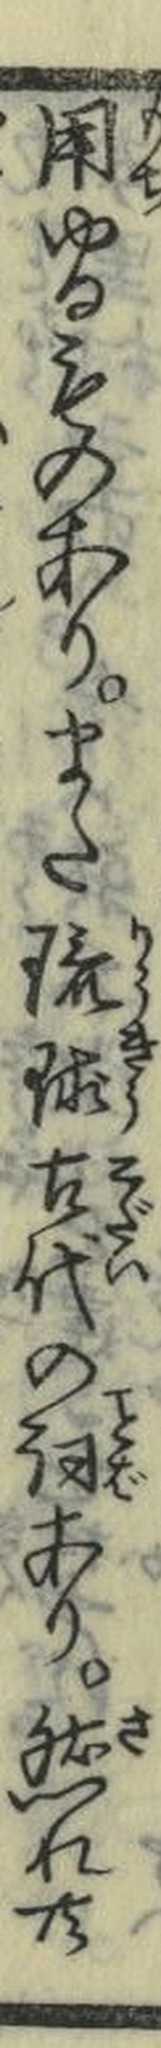用ゆるものあり。また琉球古代の詞あり。然れ共
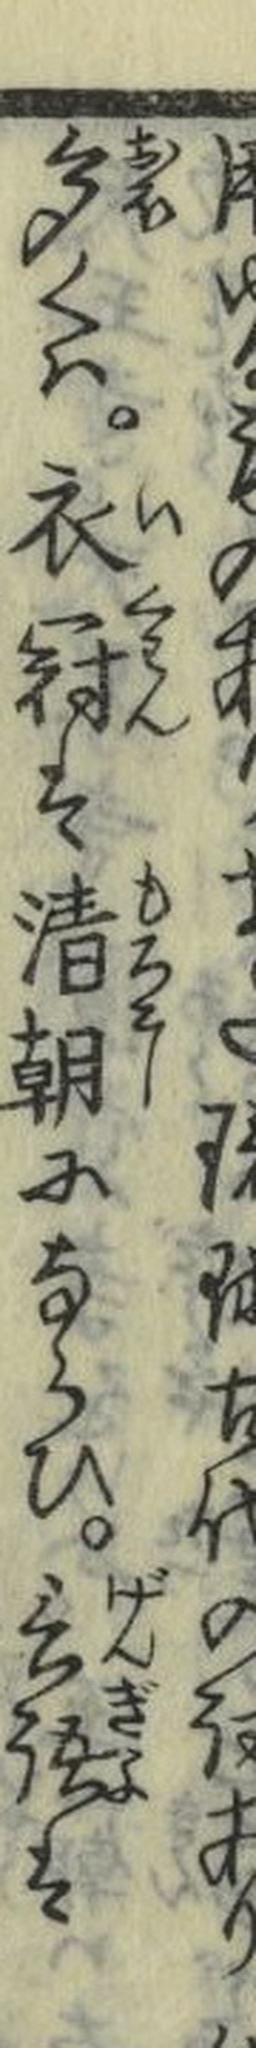多くハ。衣冠は清朝にならひ。言語は
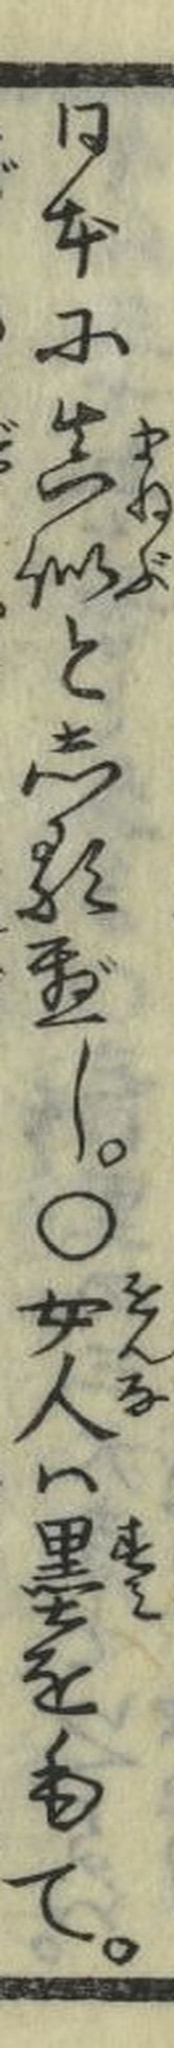日本に真似としるべし。〇女人ハ墨をもて。
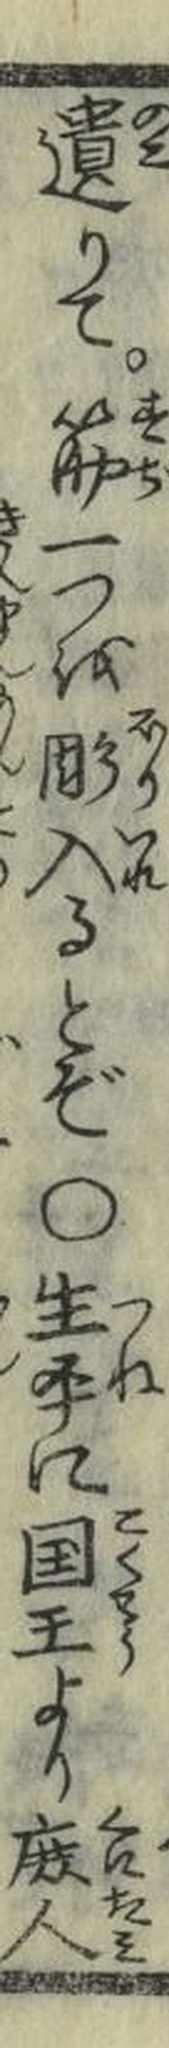遺りて。筋一つを彫入るとぞ○生平に国王より庻人
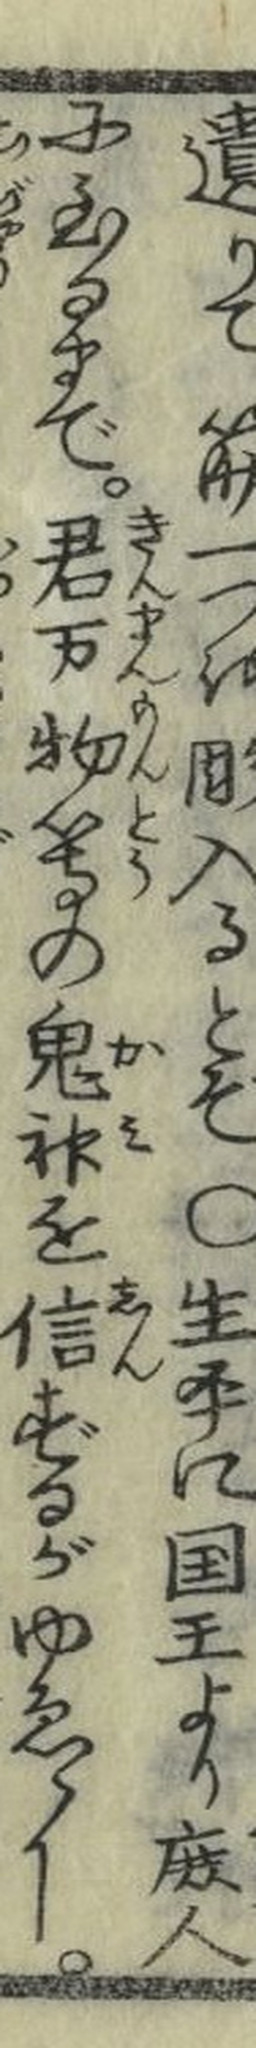に至るまで。君万物等の鬼神を信ずるゆゑに。
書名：琉球奇譚
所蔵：University of the Ryukyus Library
